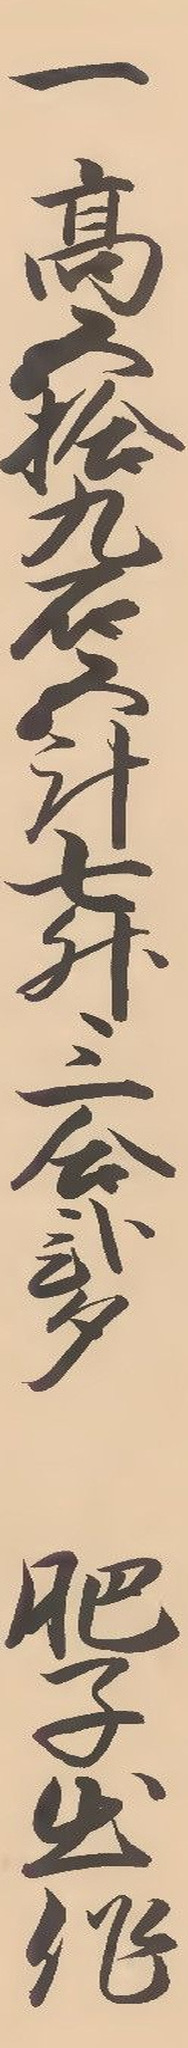一高五拾九石五斗七升三合弐勺肥子出作
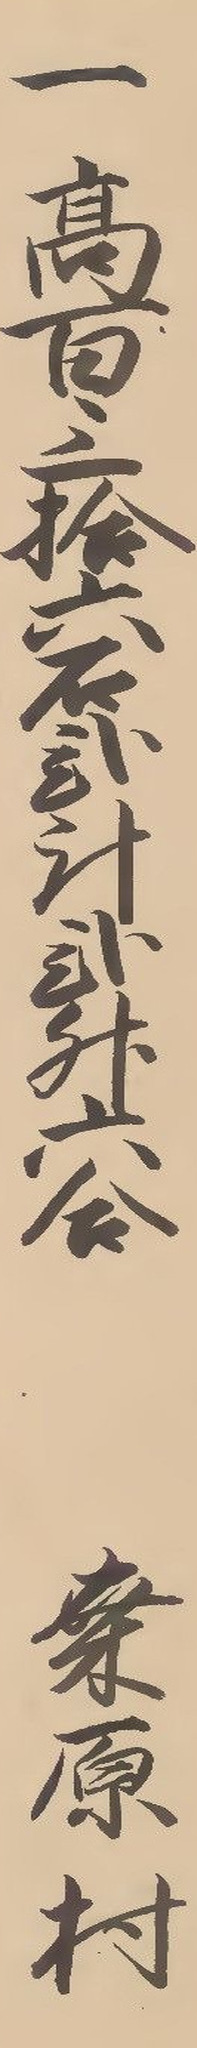一高百三拾六石弐斗弐升六合桑原村
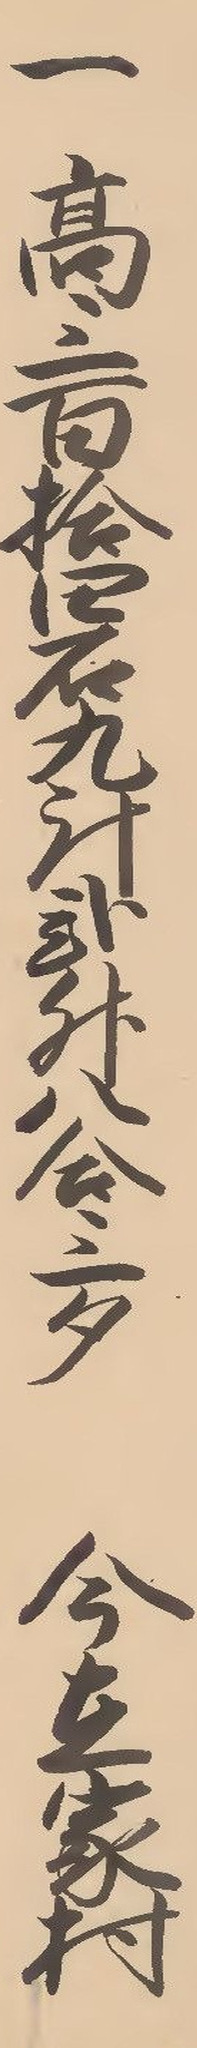一高三百拾四石九斗弐升八合三勺今在家村
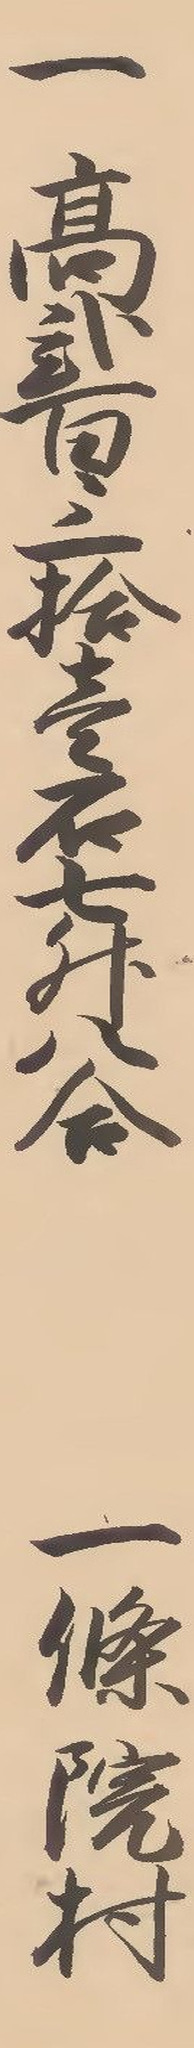一高弐百三拾壱石七升八合一条院村
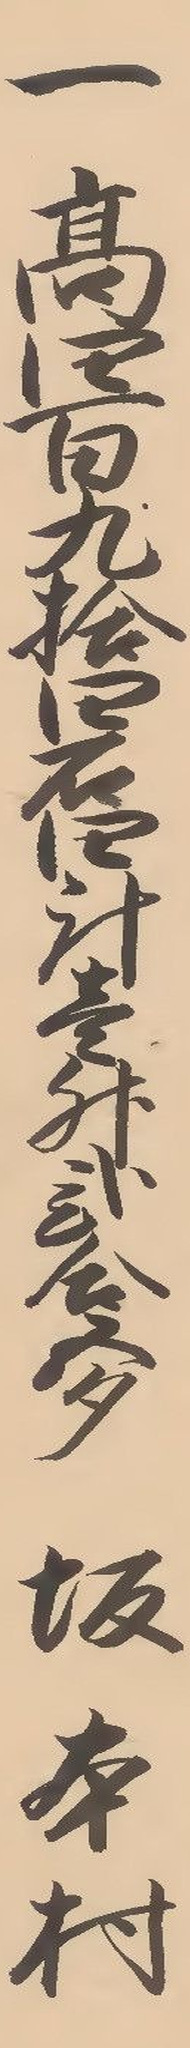一高四百九拾四石四斗壱升弐合五勺坂本村

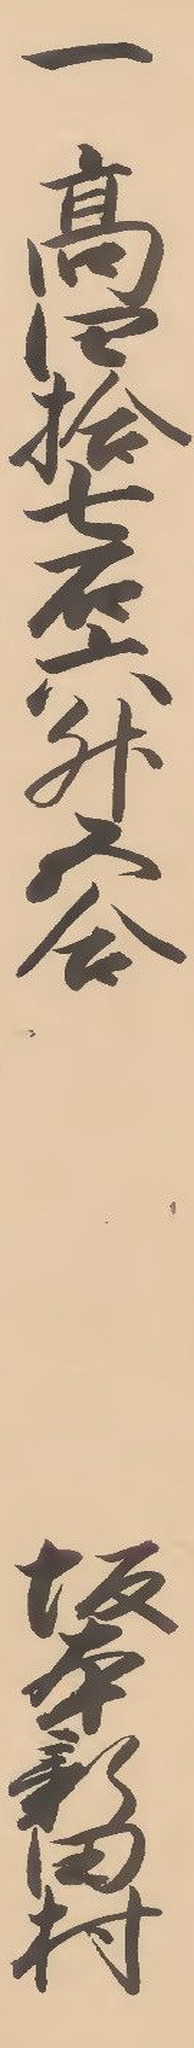一高四拾七石六升五合坂本新田村
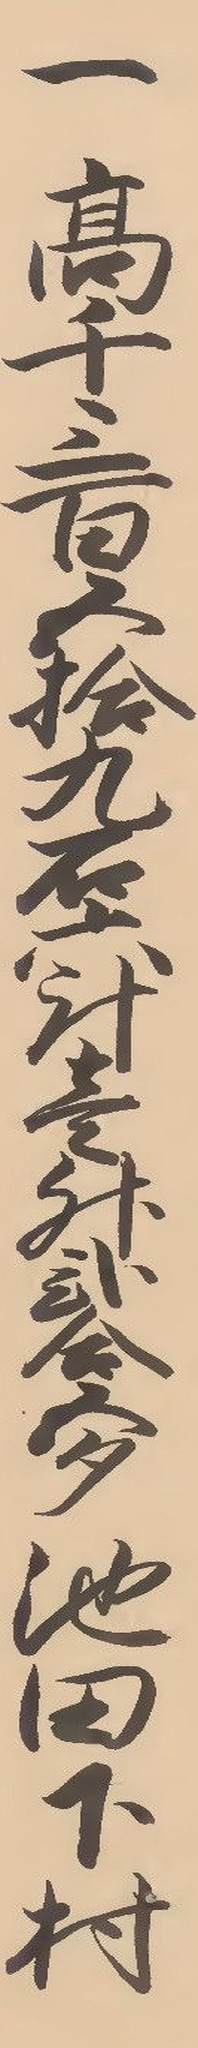一高千三百五拾九石六斗壱升弐合五勺池田下村
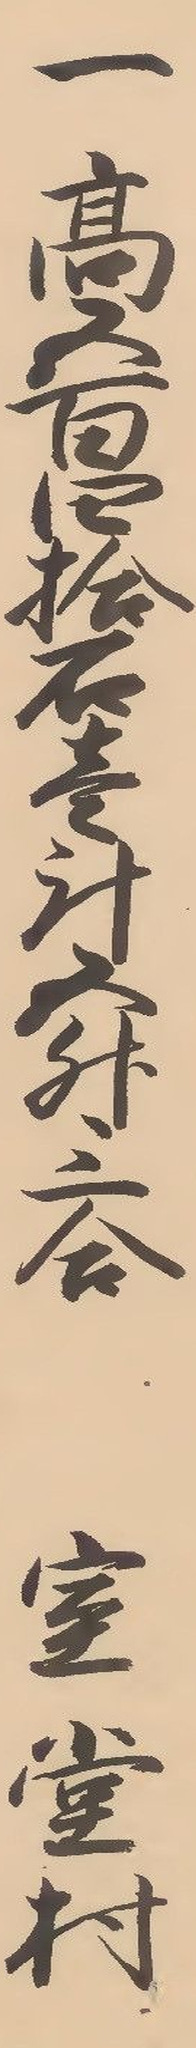一高五百四拾石壱斗五升三合室堂村
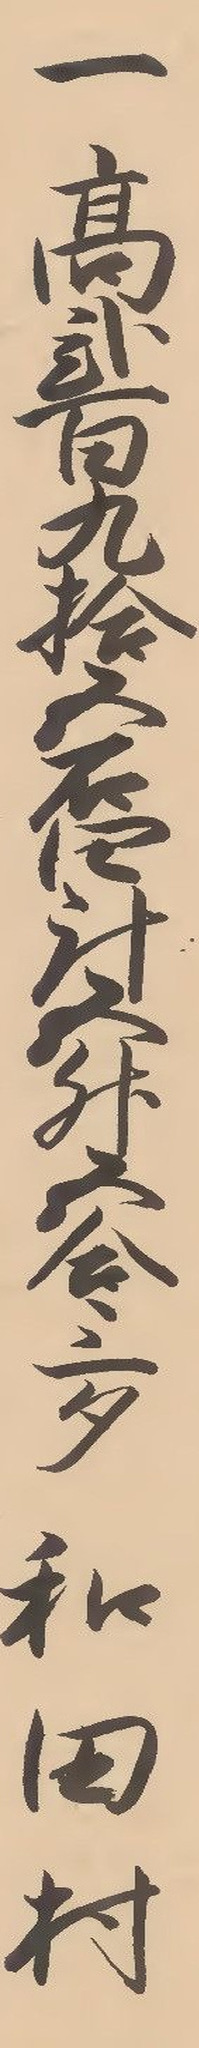一高弐百九拾五石四斗五升五合三勺和田村
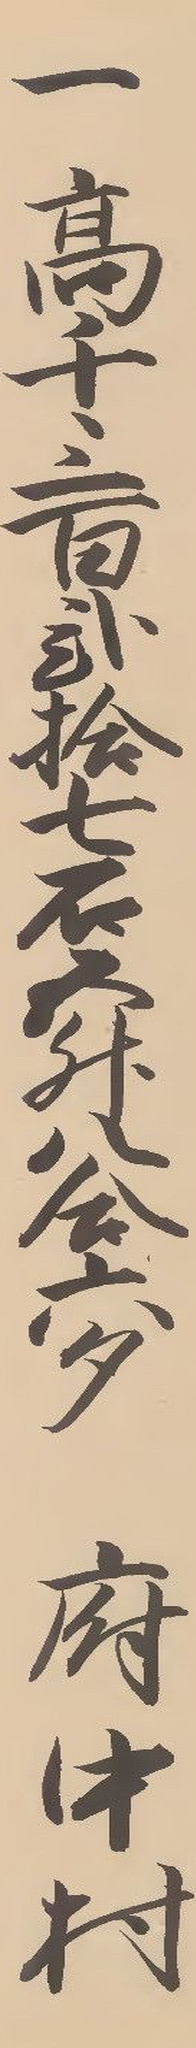一高千三百弐拾七石五升八合六勺府中村
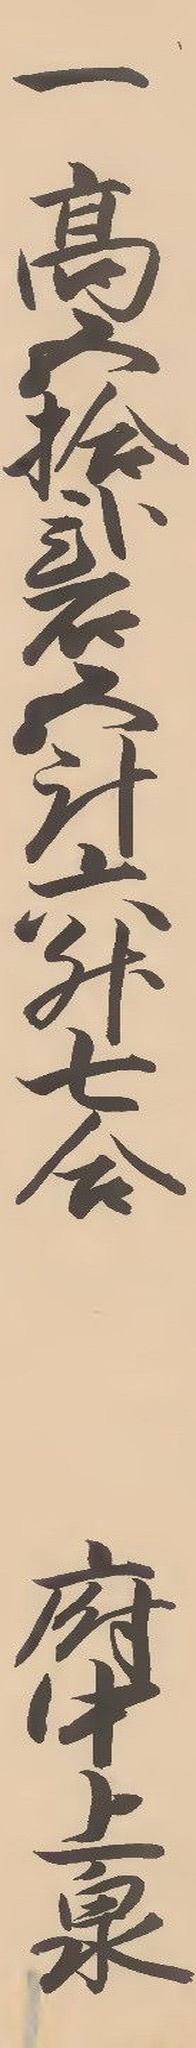一高五拾弐石五斗六升七合府中上泉
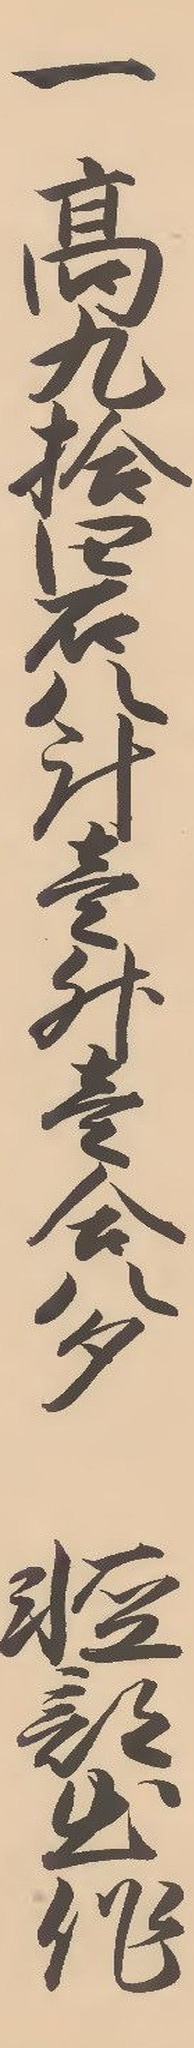一高九拾四石八斗壱升壱合八勺軽部出作
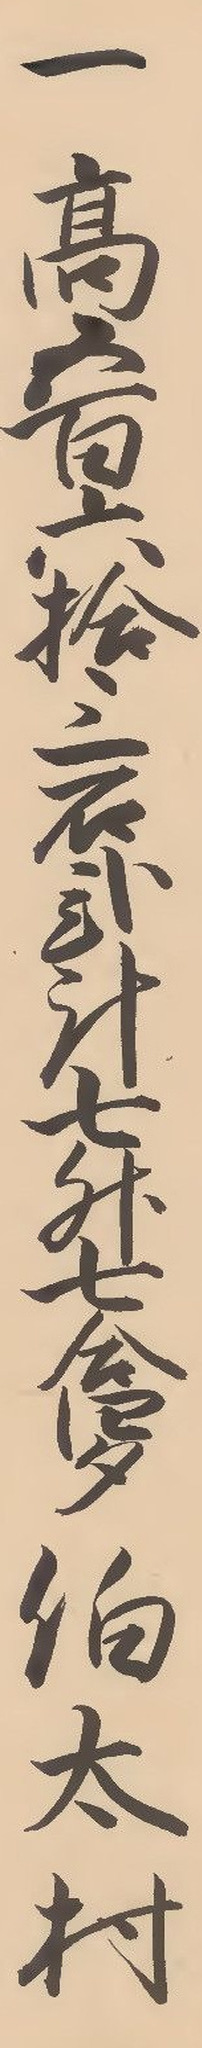一高五百六拾三石弐斗七升七合四勺伯太村

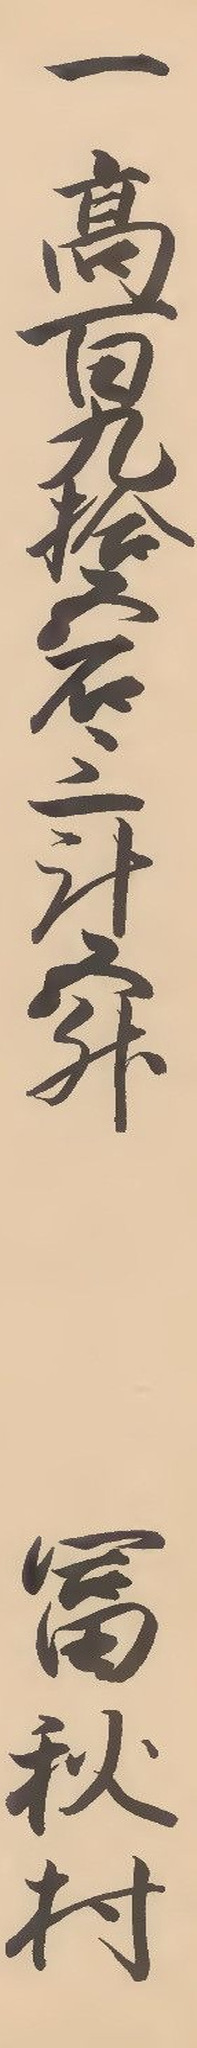一高百九拾五石三斗五升富秋村
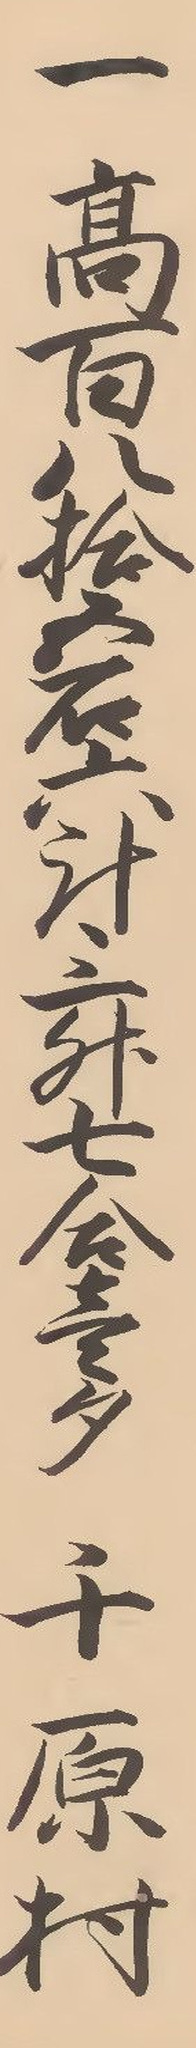一高百八拾五石六斗三升七合壱勺千原村
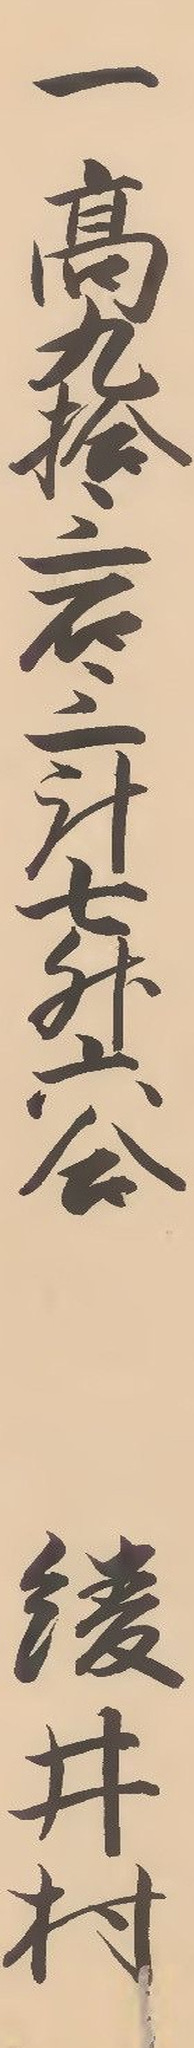一高九拾三石三斗七升六合綾井村
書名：和泉国郷帳
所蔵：国立公文書館 National Archives of Japan
